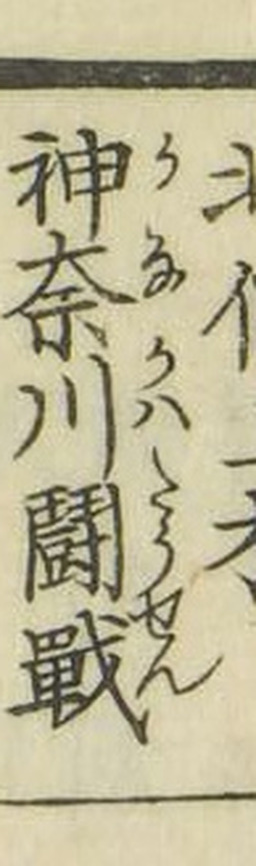神奈川闘戦

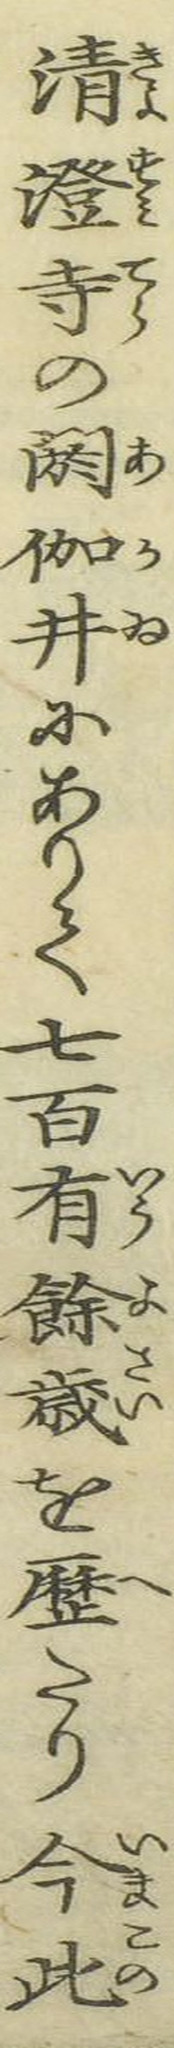清澄寺の閼伽井にありて七百有餘歳を歴たり今此
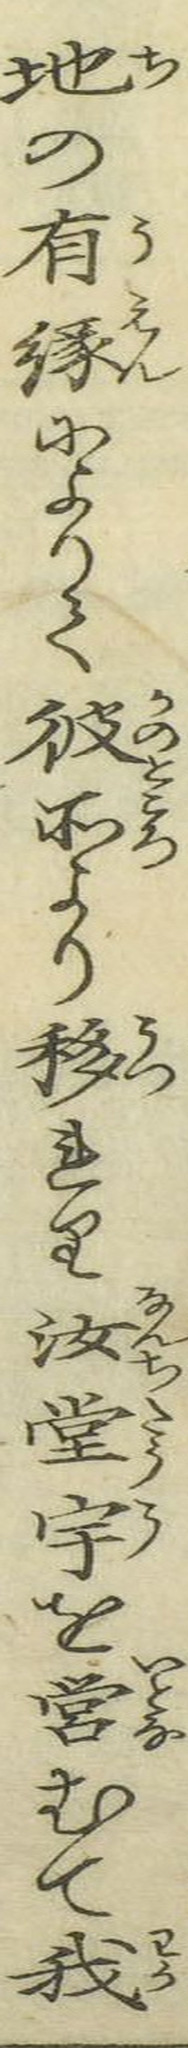地の有縁によりて彼所より移れり汝堂宇を営むて我
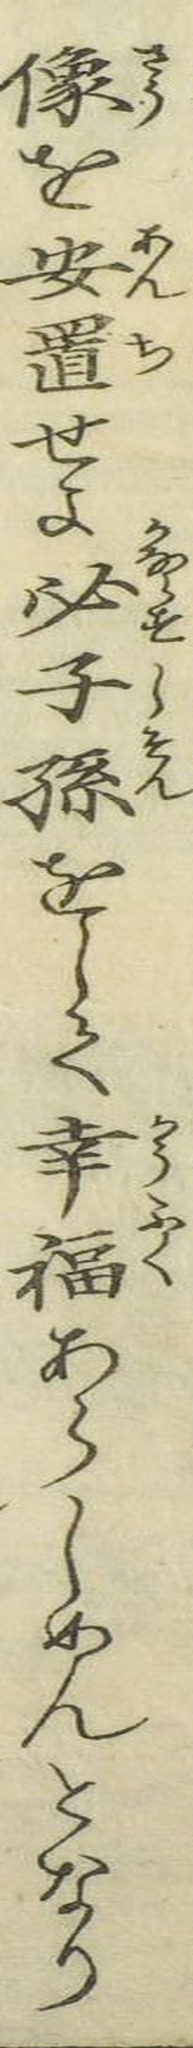像を安置せよ必子孫をして幸福あらしめんとなり
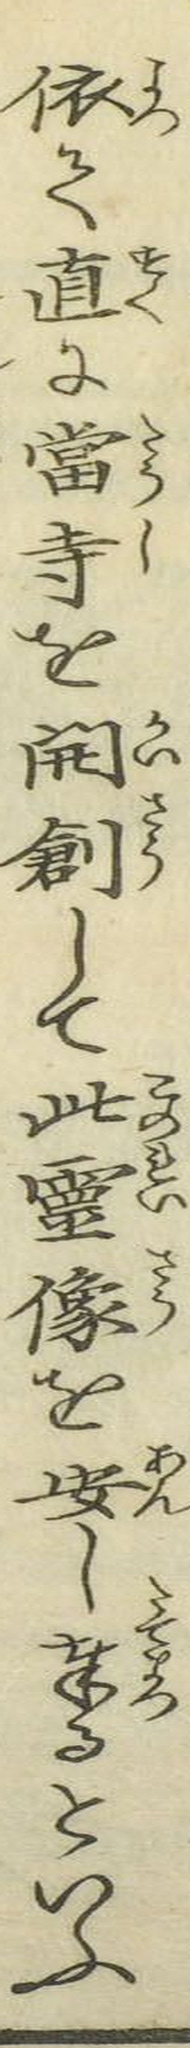依て直に當寺を開創して此霊像を安し奉るといふ
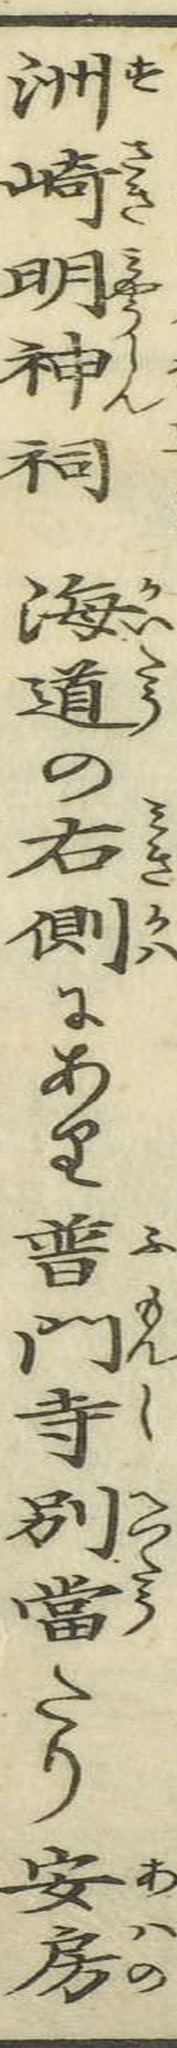洲崎明神祠海道の右側にあり普門寺別當たり安房
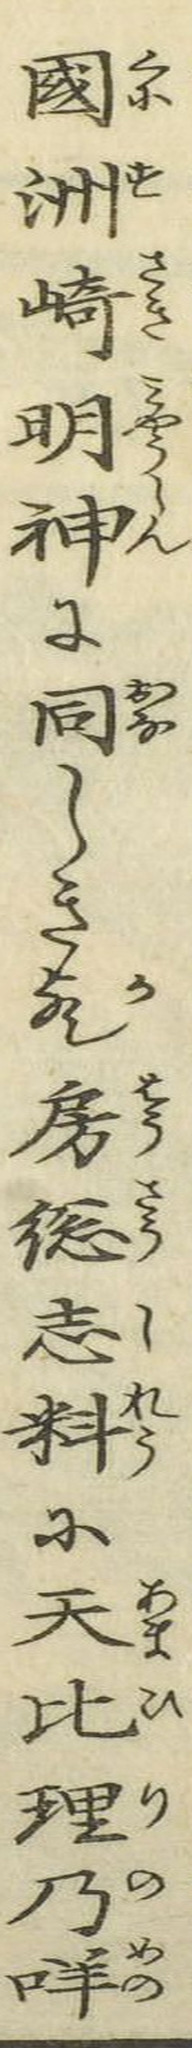國洲崎明神に同しき歟房総志料に天比理乃咩
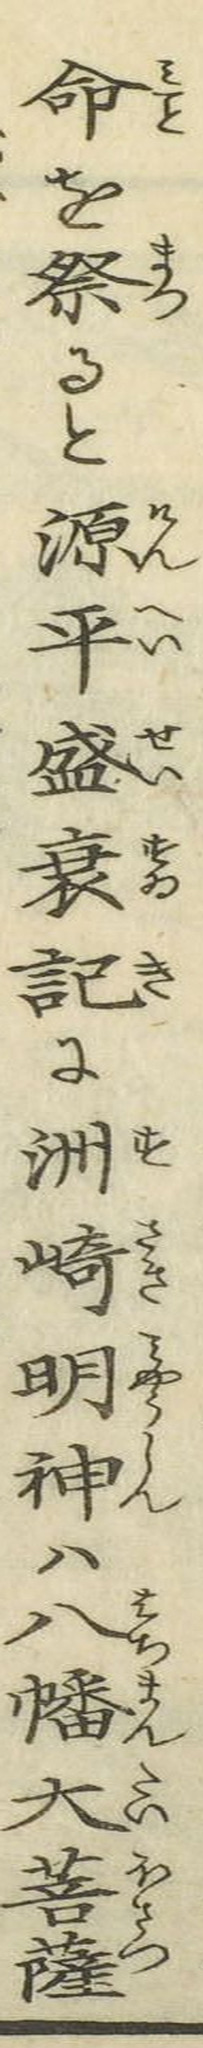命を祭ると源平盛衰記に洲崎明神は八幡大菩薩
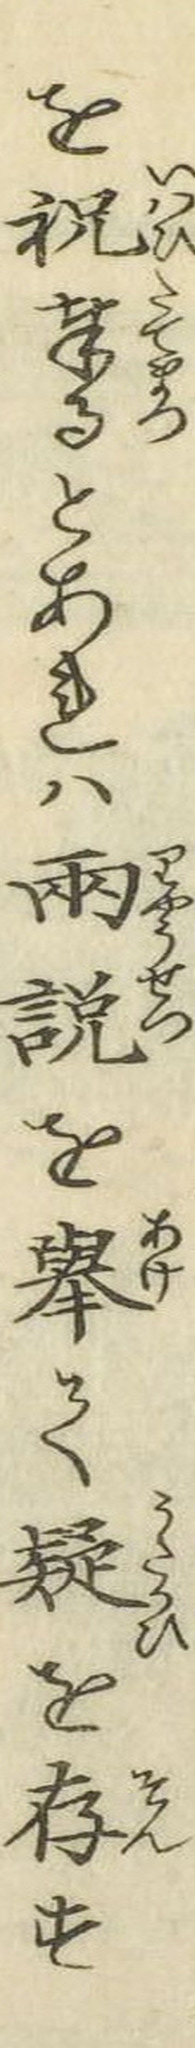を祝奉るとあれは両説を挙て疑を存す
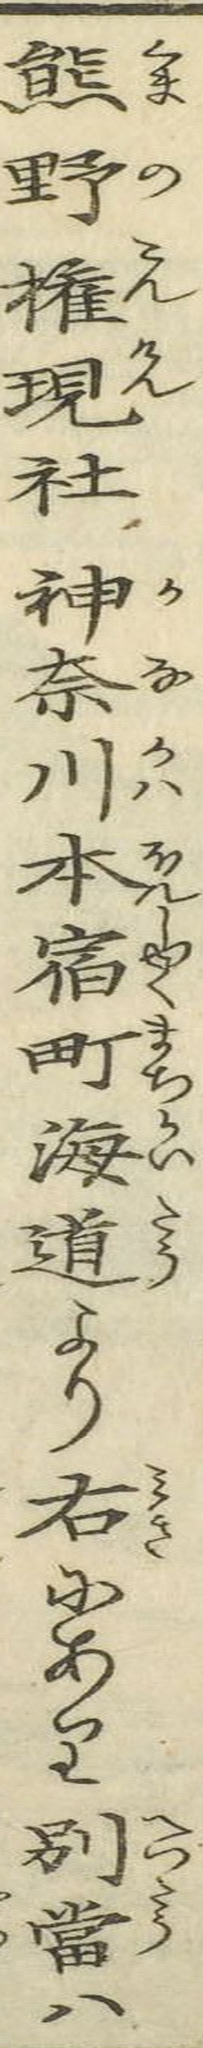熊野権現社神奈川本宿町海道より右にあり別當は
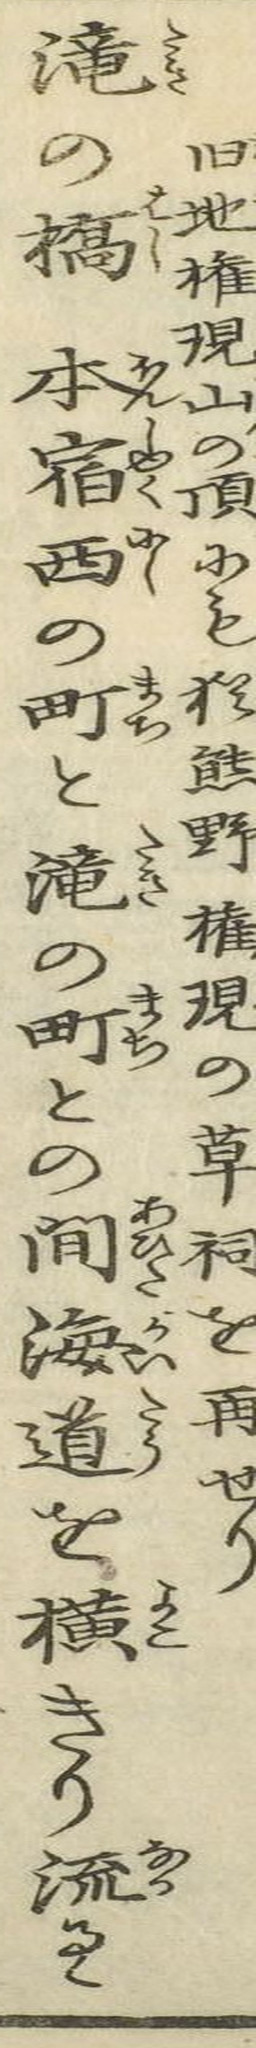滝の橋本宿西の町と滝の町との間海道を横きり流るゝ
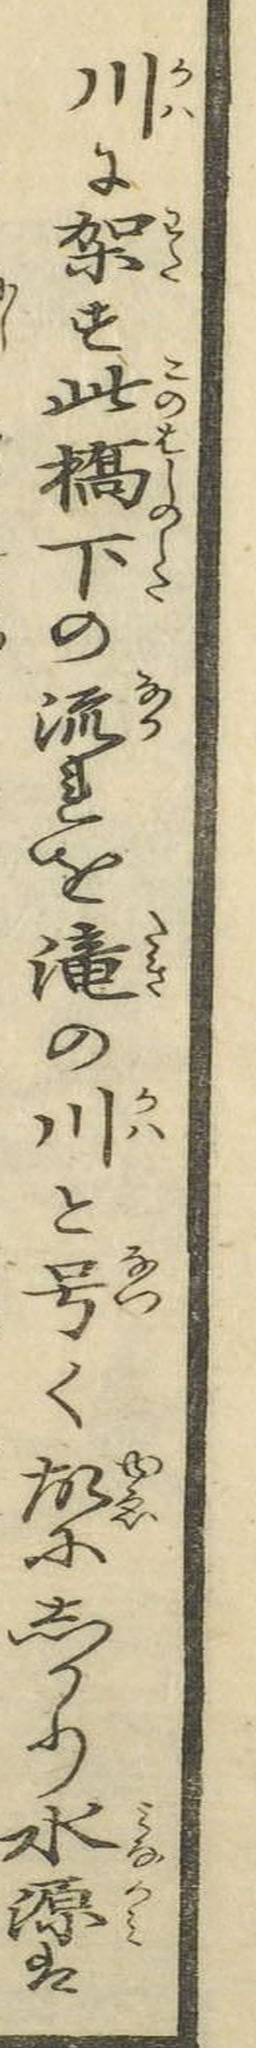川に架す此橋下の流れを滝の川と号く故にしかり水源は
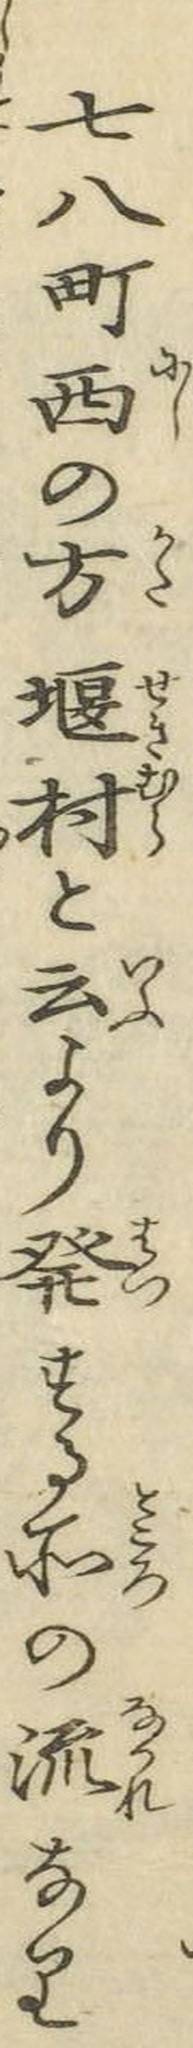七八町西の方堰村と云より発する所の流なり
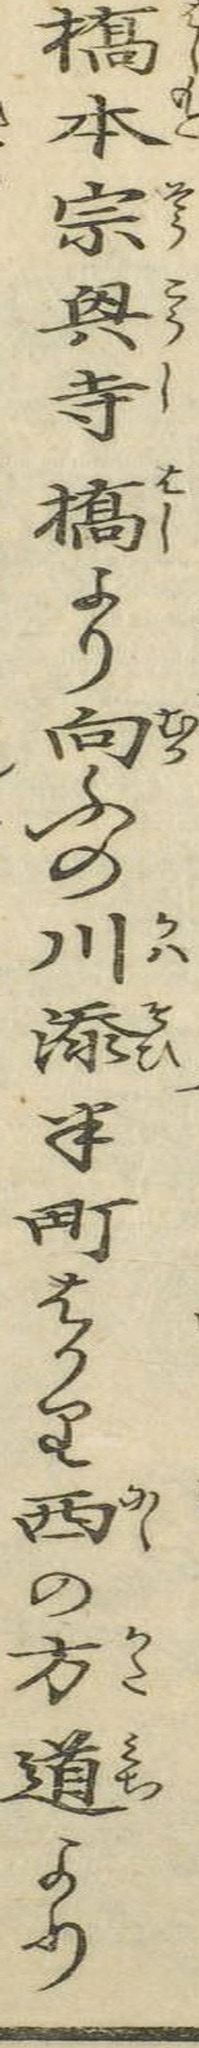橋本宗興寺橋より向ふの川添半町はかり西の方道より
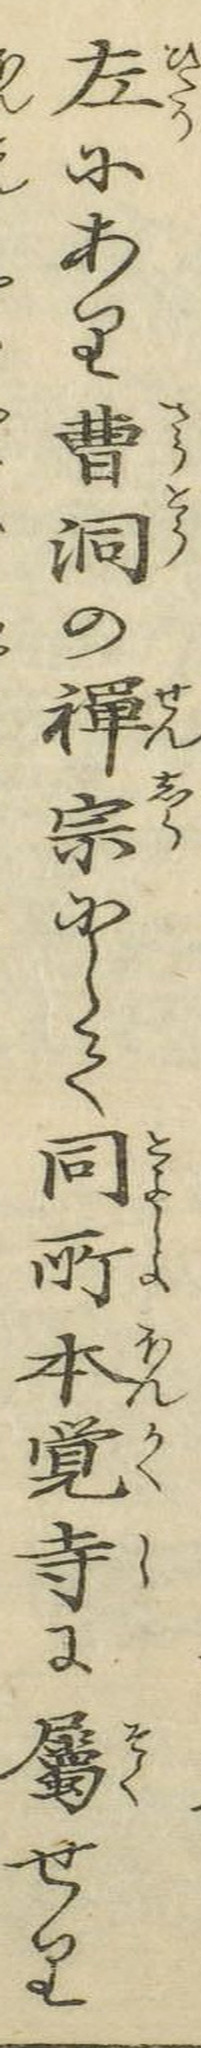左にあり曹洞の禅宗にして同所本覚寺に属せり
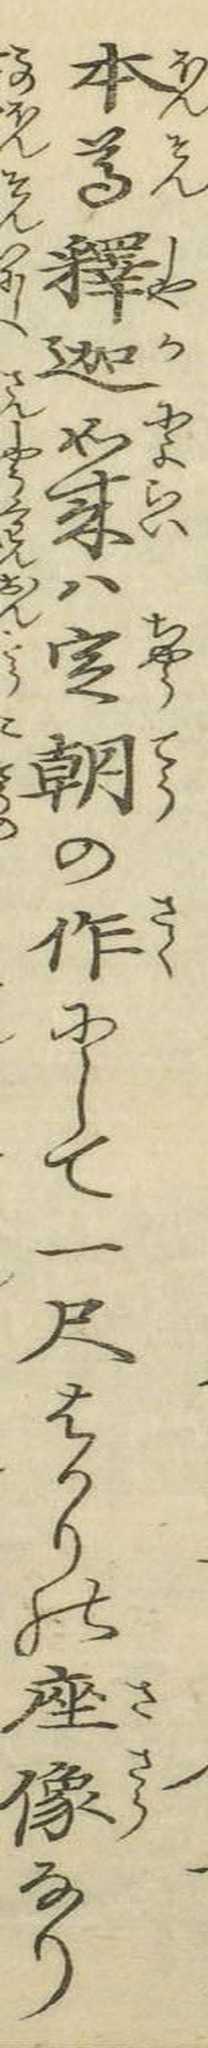本尊釋迦如来は定朝の作にして一尺はかりの座像なり
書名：江戸名所図会 20巻 巻之5
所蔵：東京学芸大学教育コンテンツアーカイブ
